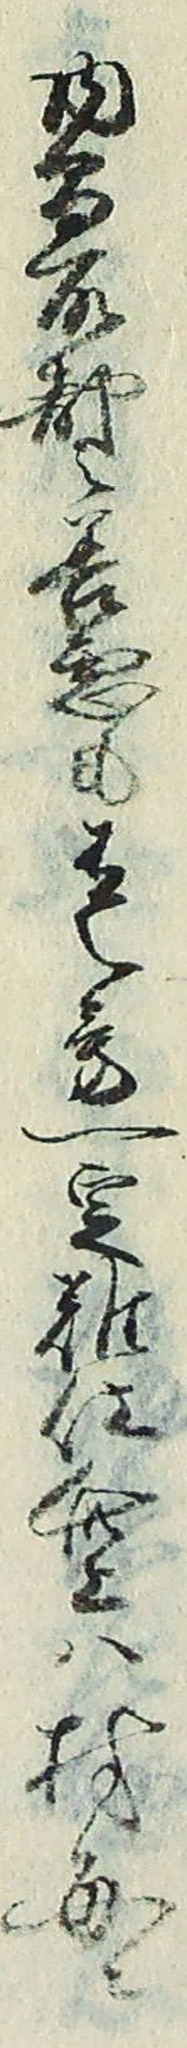内間取都之善悪も有之旁一定難仕此上ハ村毎ニ
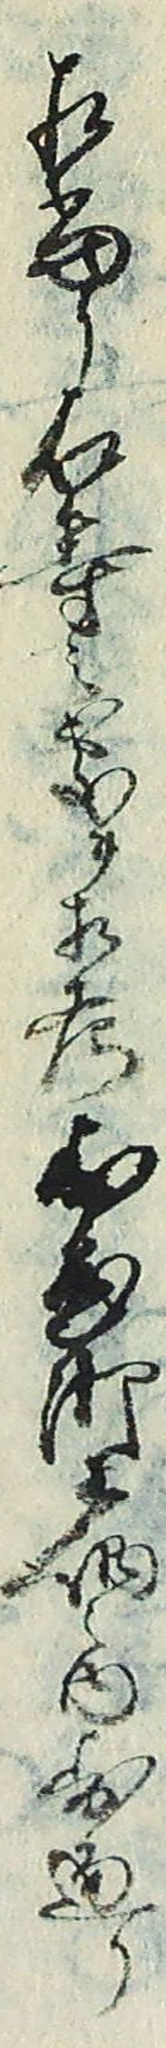相當り右等之處ヲ相考歩懸御上納之内歩通り
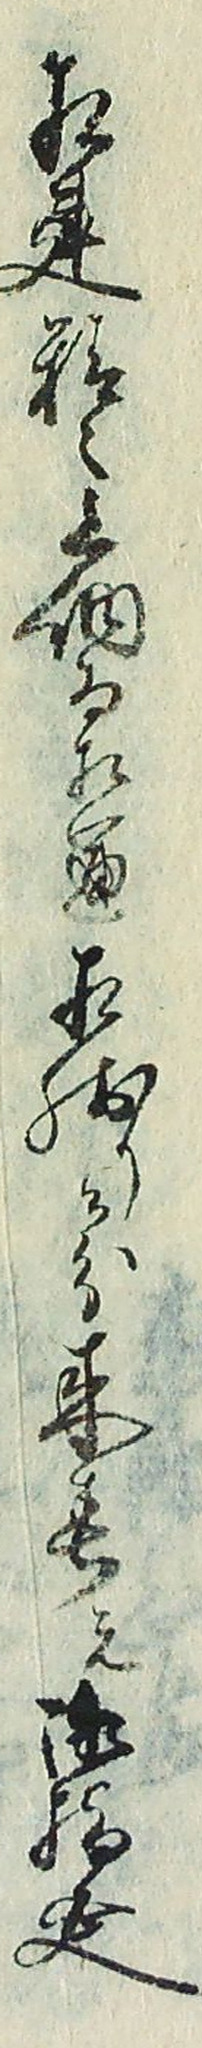相建精々上納為相運相残り候分来春え御指延
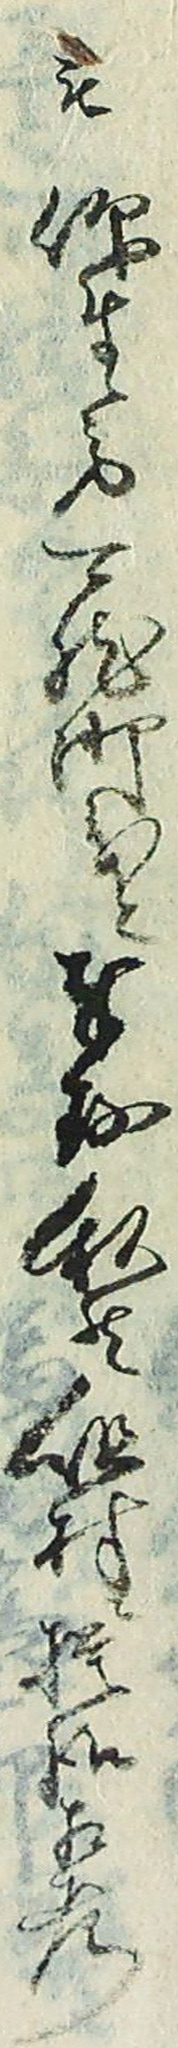被仰付候方可然御義と奉存私共組村ニ模様相考
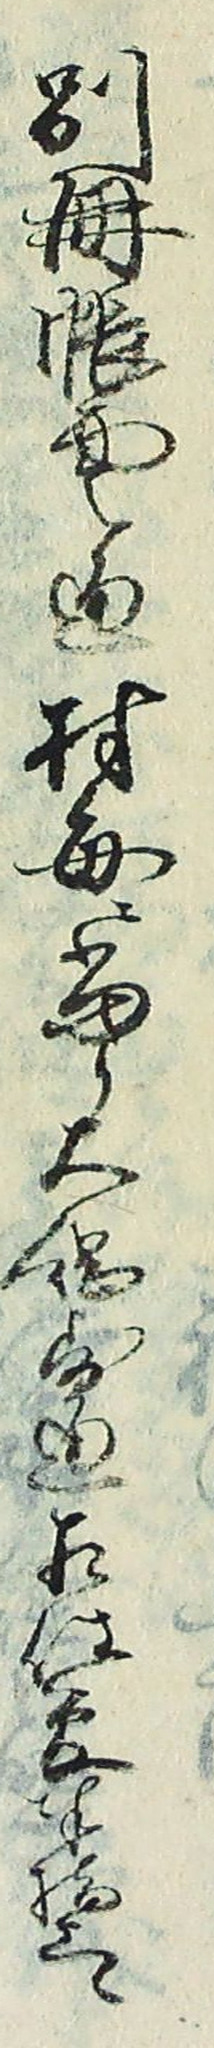別冊帳面之通村毎ニ當り大綱歩通相仕管奉指上候
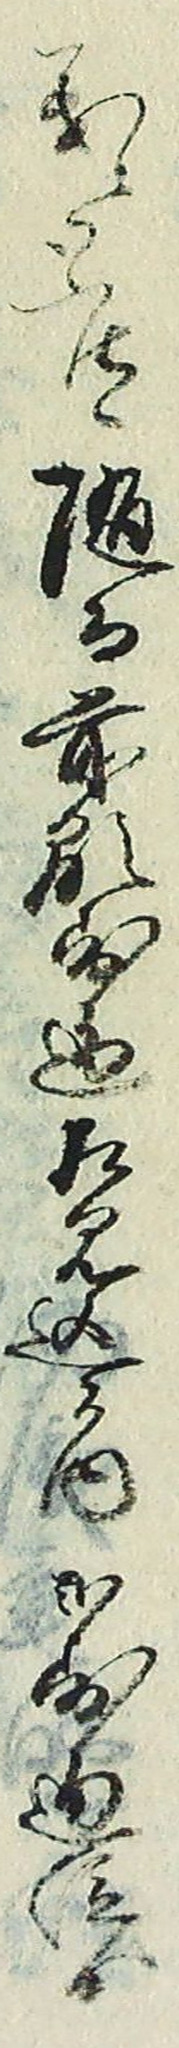義ニ御座候随而前顕歩通相見込候内弐歩通位ゟ
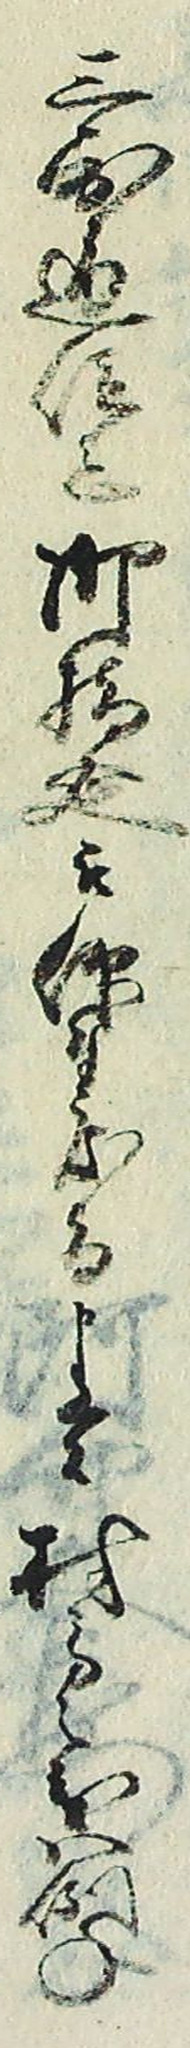三歩通位迄御指延被仰付度旨申上候村方之義ハ例年
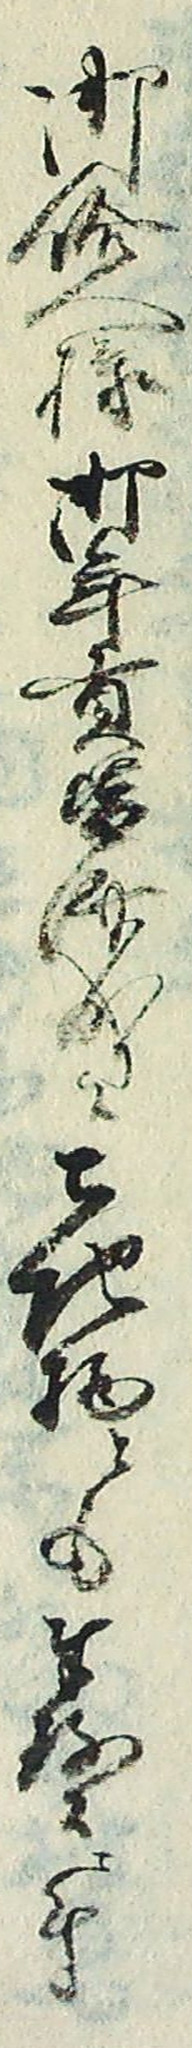御給人様御年貢皆済成り候土地柄とも奉存候ニ付
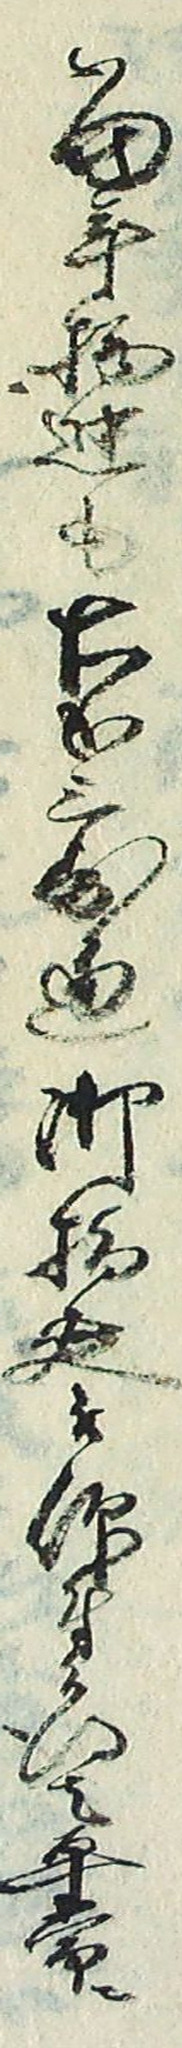當年柄迚も右弐三歩通御指延被仰付候得者平常ニ
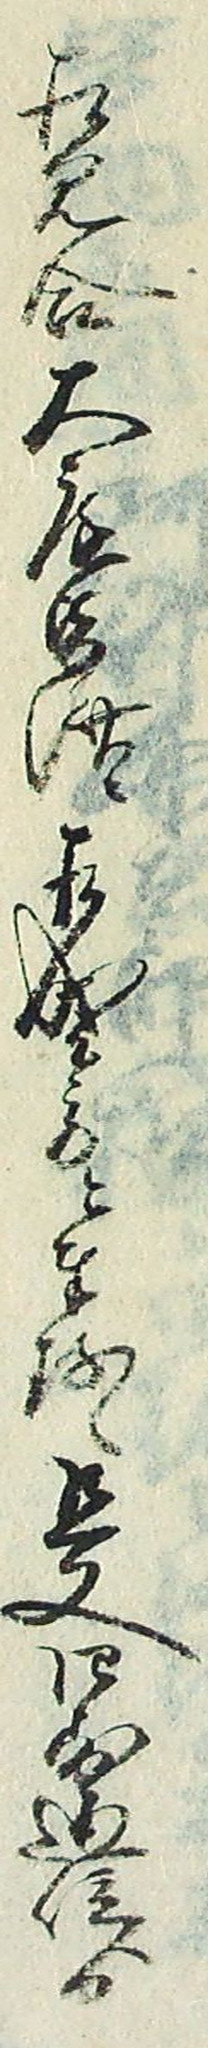相見合大底皆済ニ相成候方と奉存候且又四歩通位ゟ
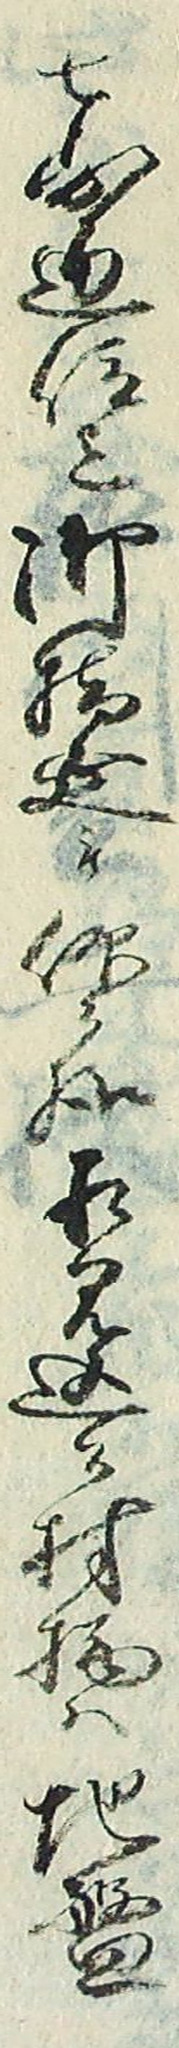七歩通位迄御指延被仰候様相見込候村柄ハ地盤
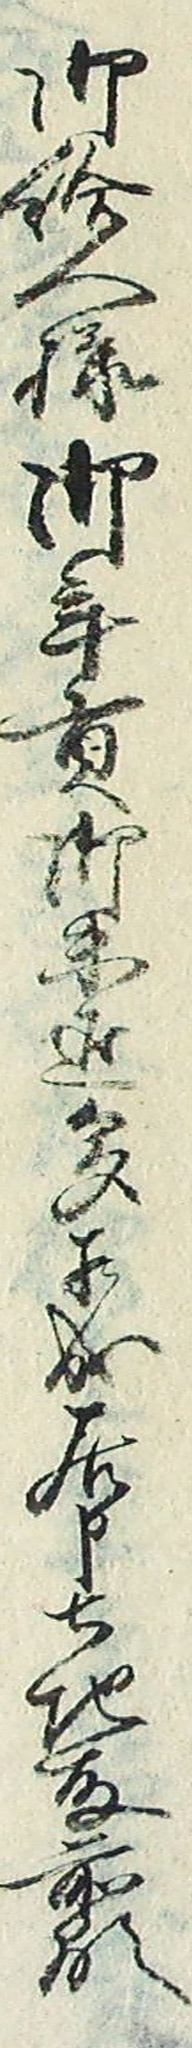御給人様御年貢御未進多相成居申土地故前顕
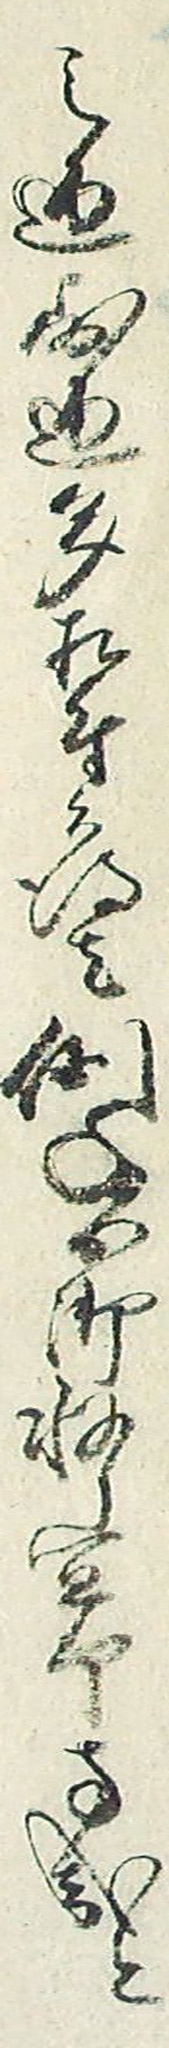之通歩通多相付候得者例年ゟ収り宜布方哉と

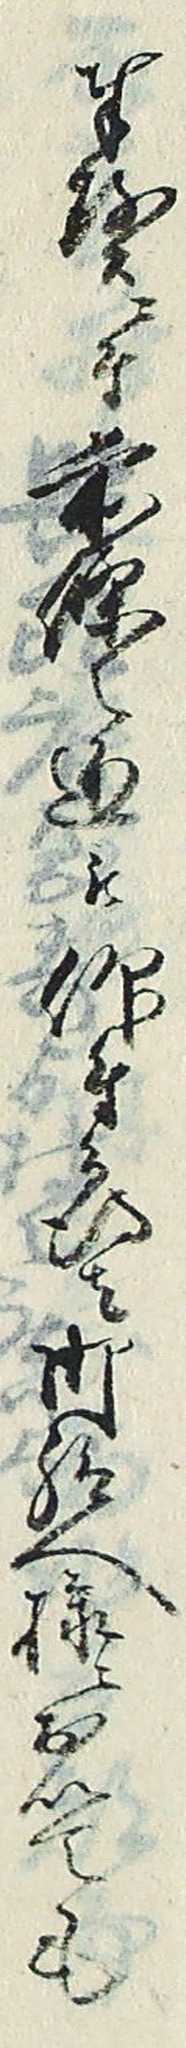奉存候ニ付前條之通被仰付候得者御給人様ニおいても
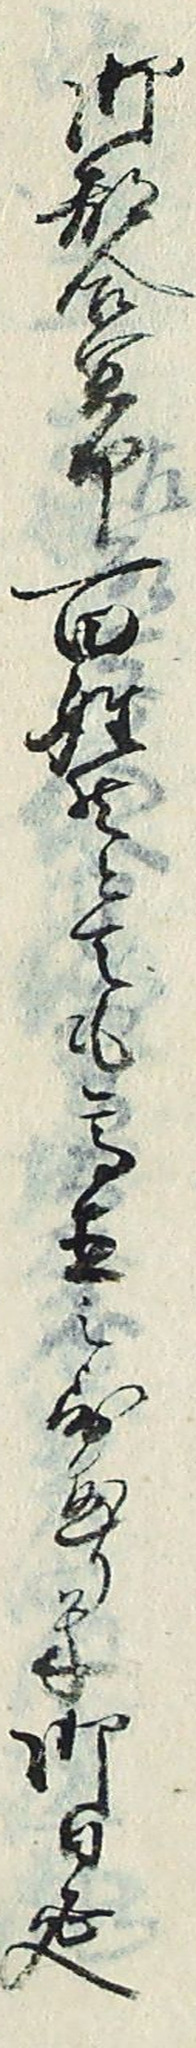御都合宜布百姓共とても高直之歩懸り米御日延
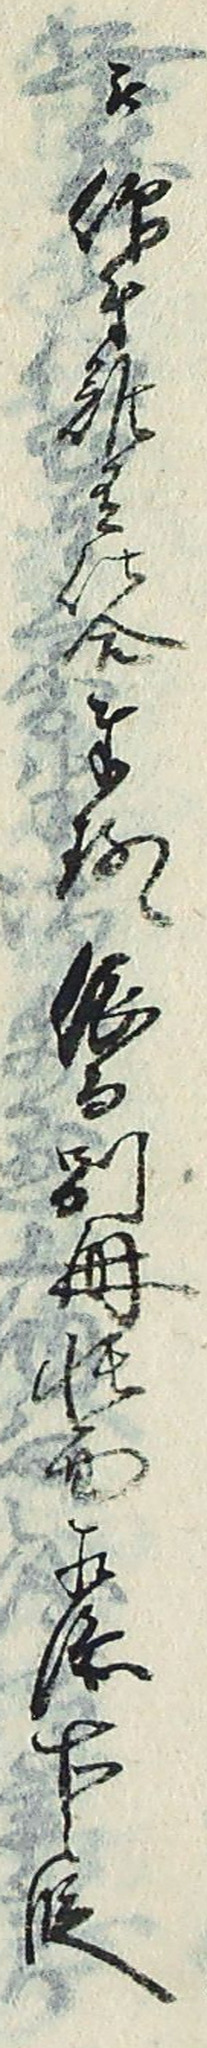被仰付難有仕合奉存候依而別冊帳面相添右之段
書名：諸御趣意書并御下知向之写
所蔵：鳴門教育大学 Naruto University of Education
